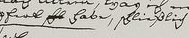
pfert schl habe, schließlich
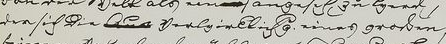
der sich die Aus Verwirklichg. eines großen,
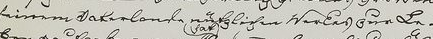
seinem Vaterlande nützlichen Werkes zur Le-
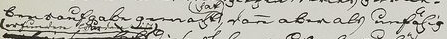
bensaufgabe gemacht hat, dann aber als unfähig
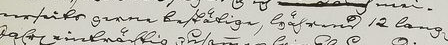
nerseits gerne bestätige, während zwölf langen
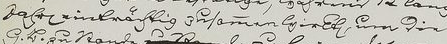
Jahren einträchtig zusammenwirkten, um die
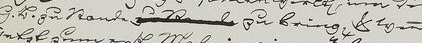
G.B. zu Stande zu Stande zu bringen, & wenn
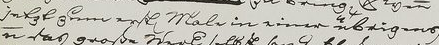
jetzt zum ersten Male in einer übrigens
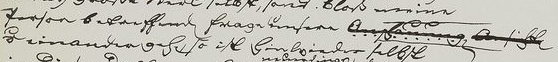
Person betreffenden Frage unsere Anschauungen Ansichten
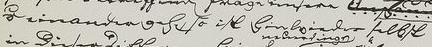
auseinandergehen, so ist hinwieder selbst
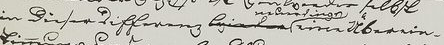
in dieser Differenz wiederneuerdings eine Überein-
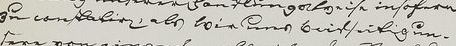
zu constatiren, als wir uns beidseitig un-
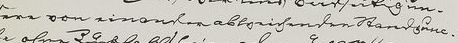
sere von einander abweichenden Standpunc-
